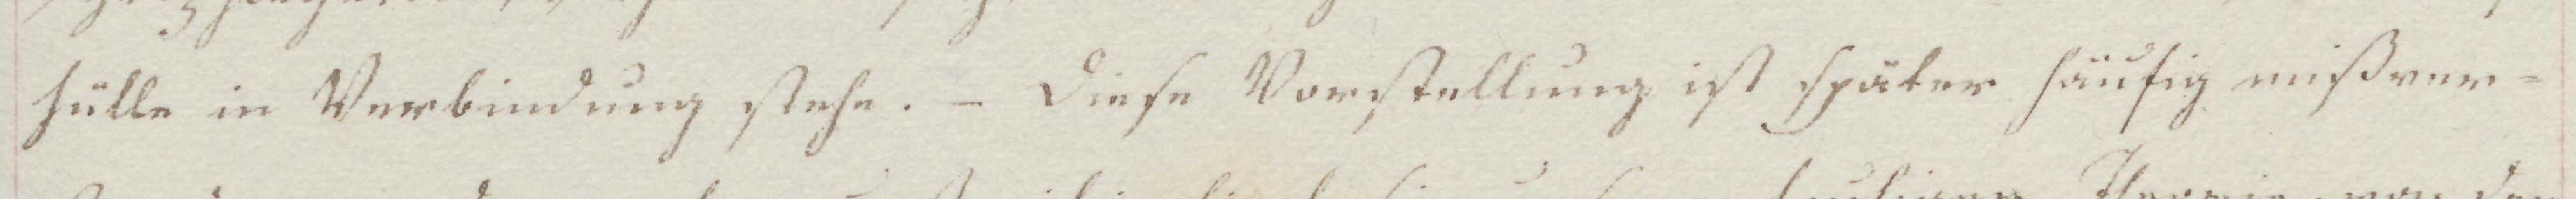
hülle in Verbindung stehe. – Diese Vorstellung ist später häufig mißver-
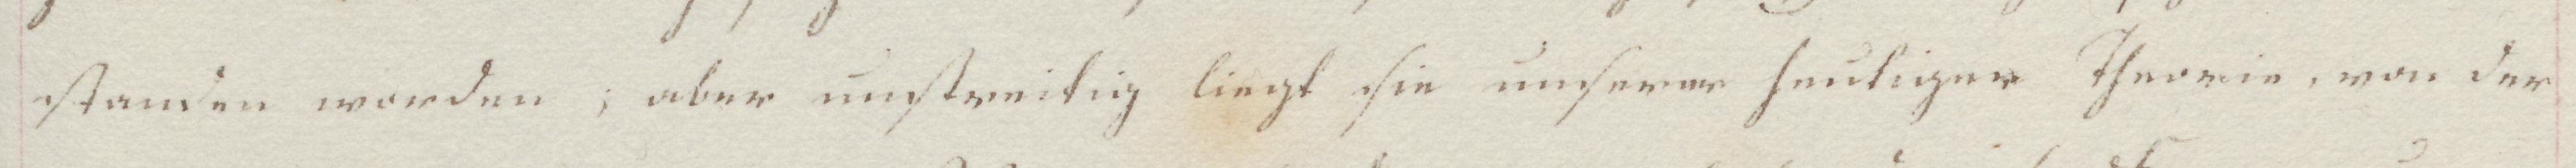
standen worden; aber unstreitig liegt sie unserer heutigen Theorie, von der
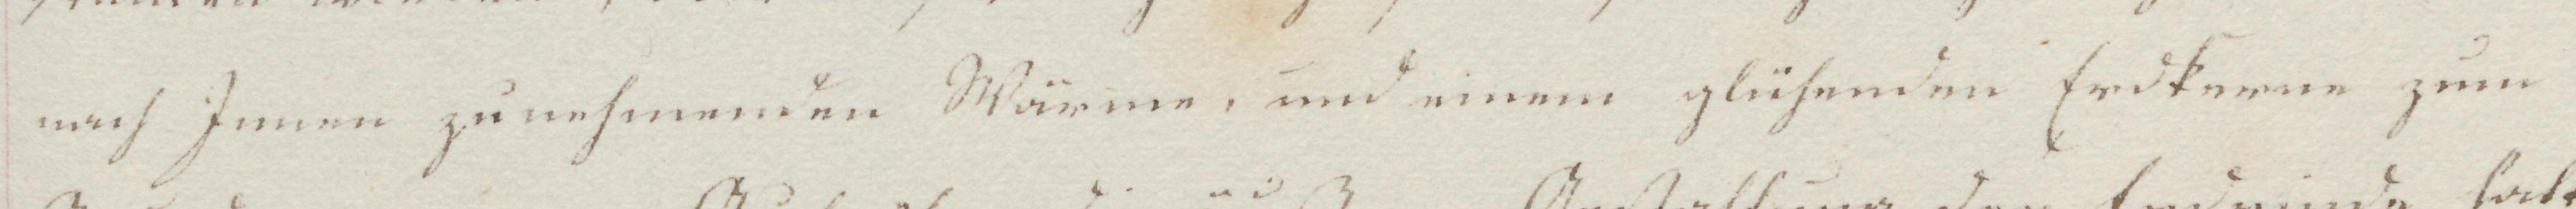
nach Innen zunehmenden Wärme, und einem glühenden Erdkern zum
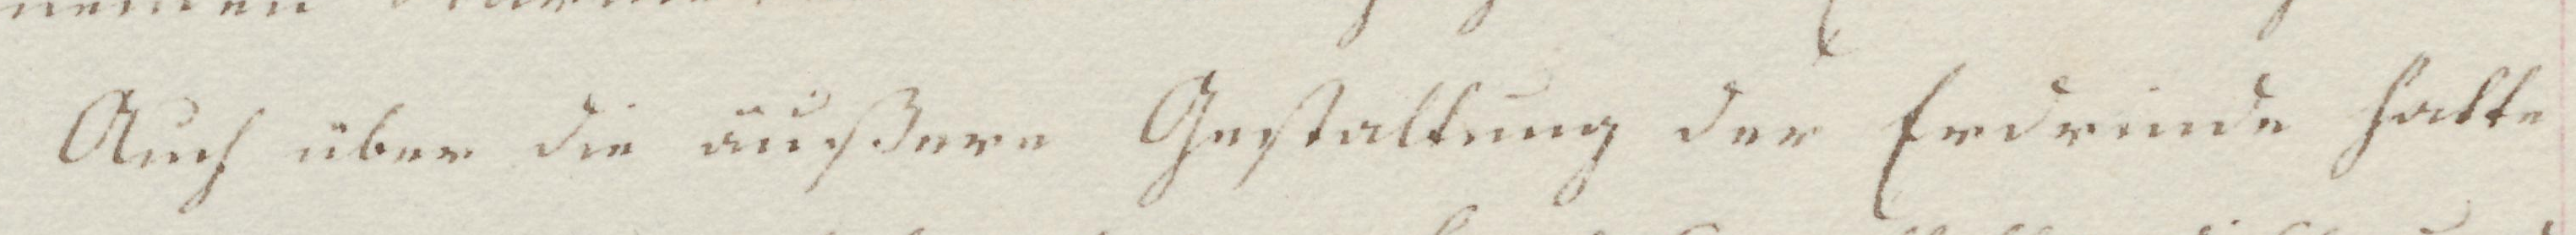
Auch über die äußere Gestaltung der Erdrinde hatte
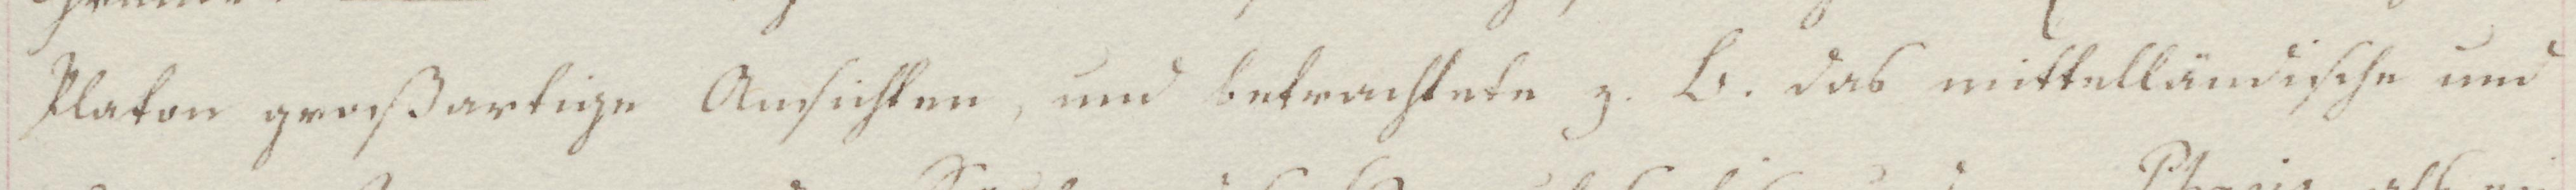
Platon großartige Ansichten, und betrachtete z. B. das mittelländische und
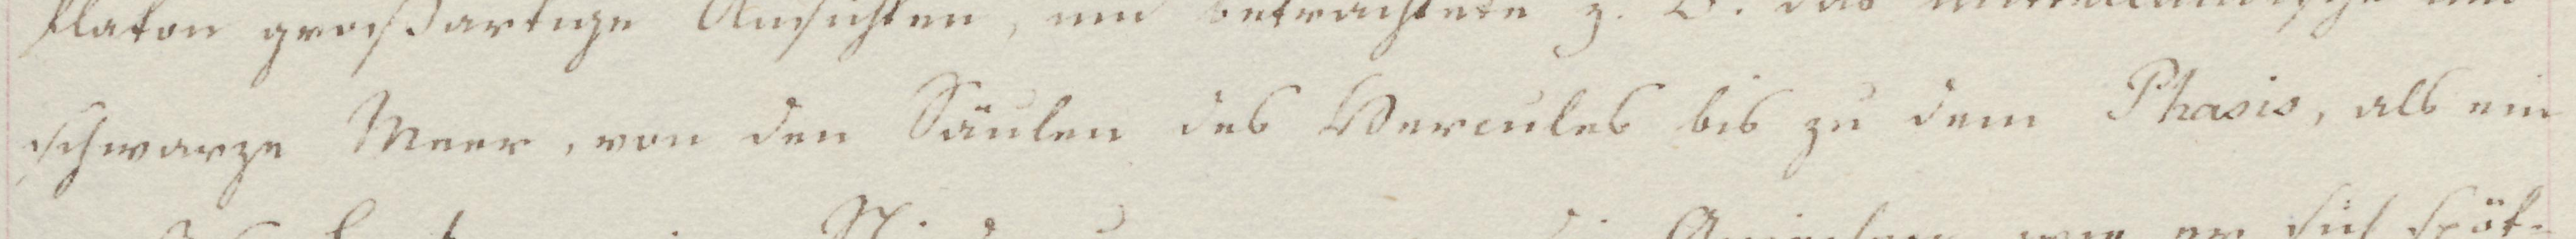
schwarze Meer, von den Säulen des Hercules bis zu dem Phasis, als ein
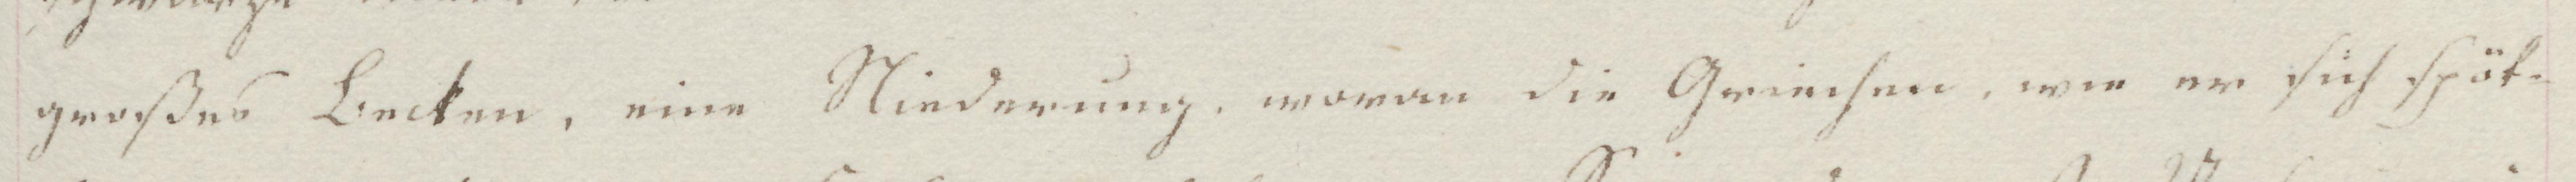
großes Becken, eine Niederung, woran die Griechen, wie er sich spöt-
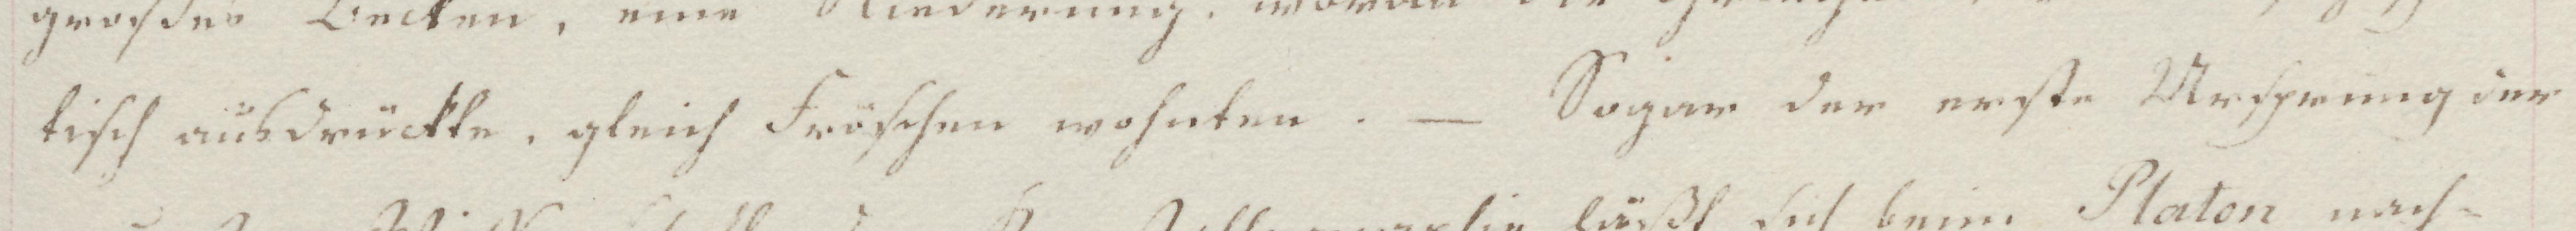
tisch ausdrückte, gleich Fröschen wohnten. – Sogar der erste Ursprung der
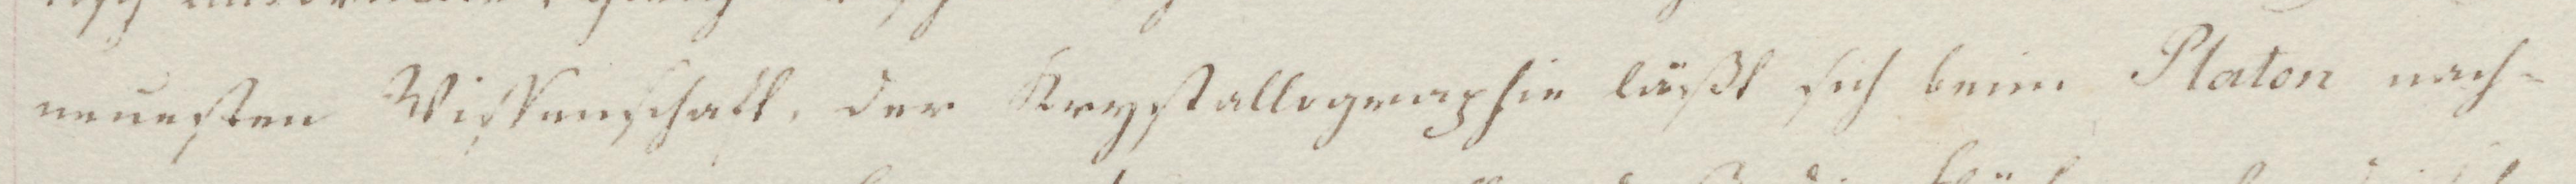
neuesten Wissenschaft, der Krystallographie läßt sich beim Platon nach-
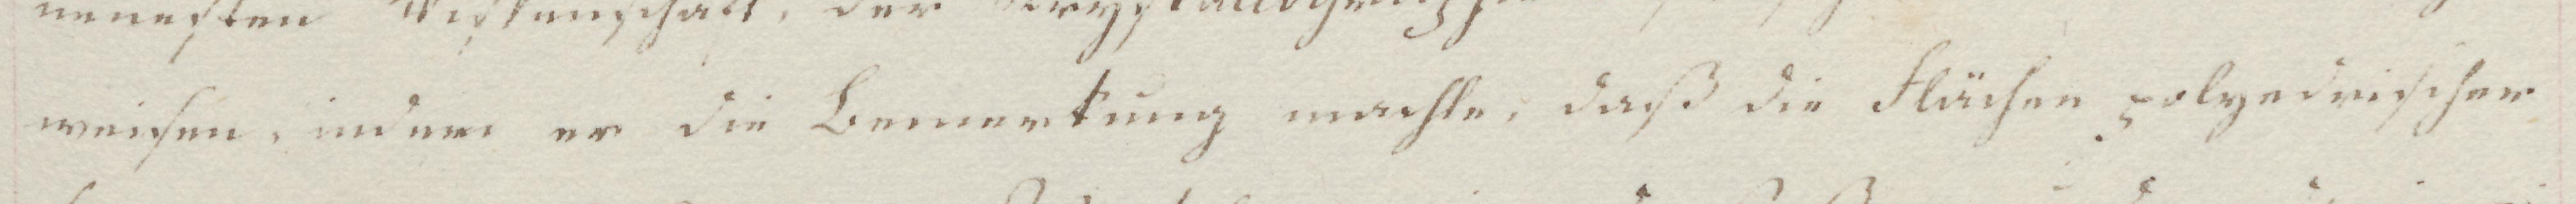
weisen, indem er die Bemerkung machte, daß die Flächen polyedrischer
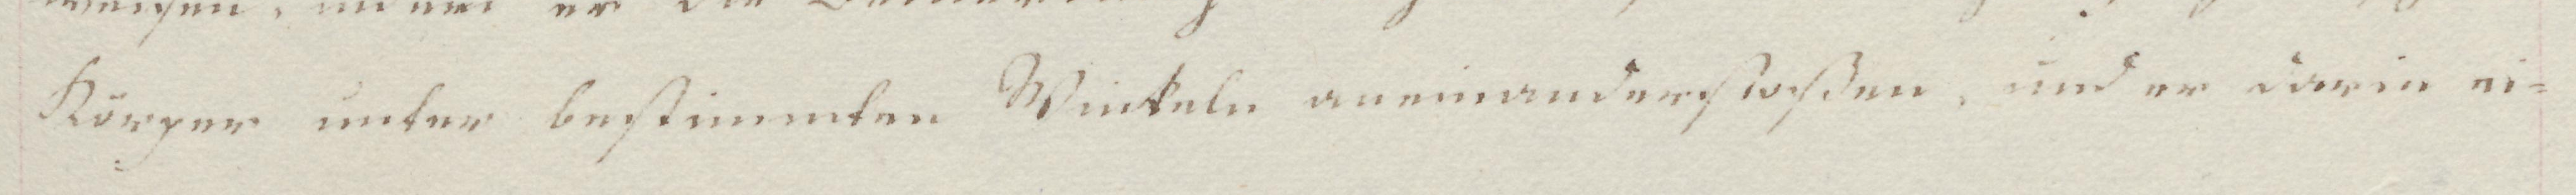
Körper unter bestimmten Winkeln aneinanderstoßen, und er darin ei-
